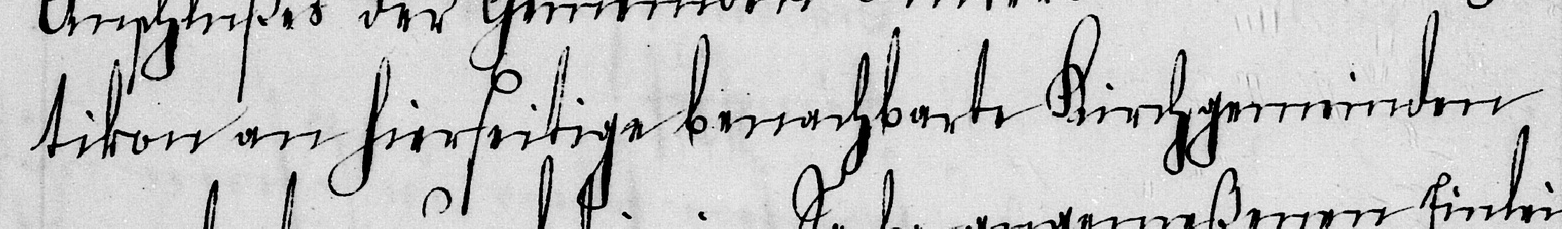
tikon an hierseitige benachbarte Kirchgemeinden
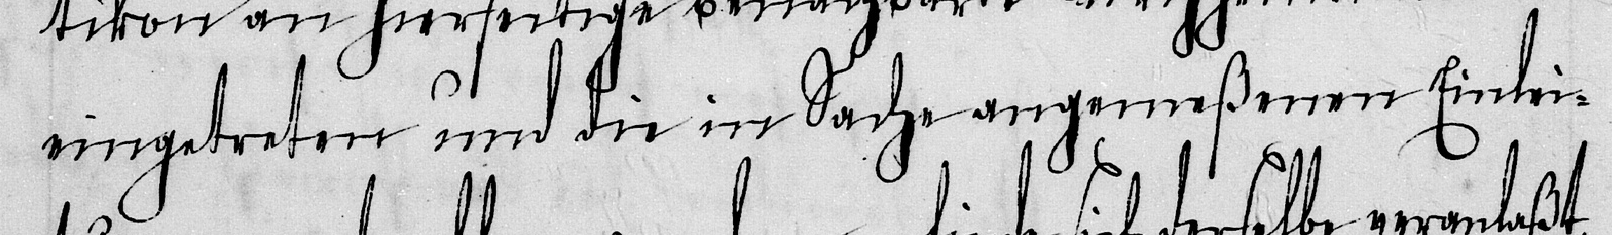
eingetreten und die in Sache angemeßenen Einlei¬
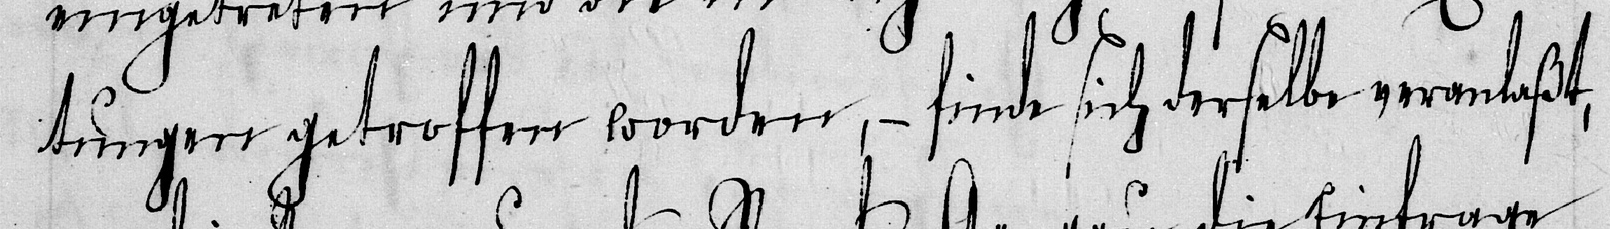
tungen getroffen worden, – finde sich derselbe veranlaßt,
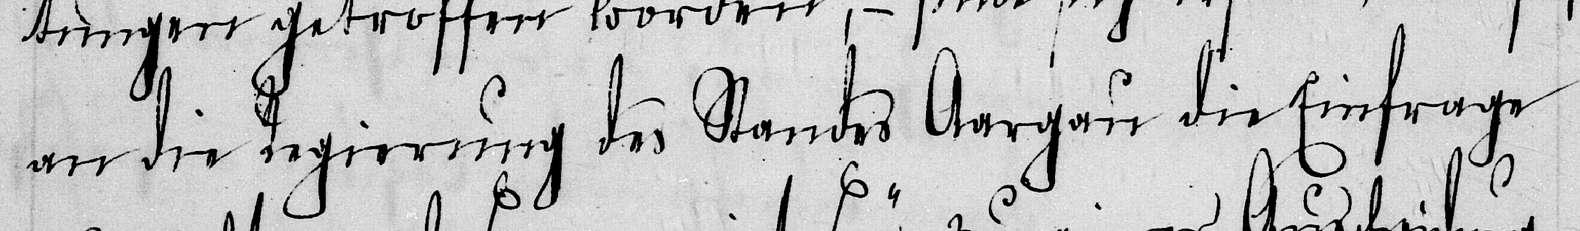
an die Regierung des Standes Aargau die Einfrage
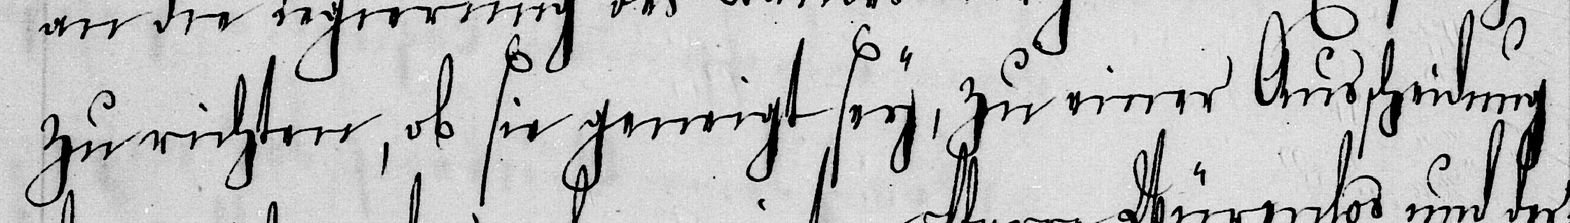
zu richten, ob sie geneigt sey, zu einer Ausscheidung
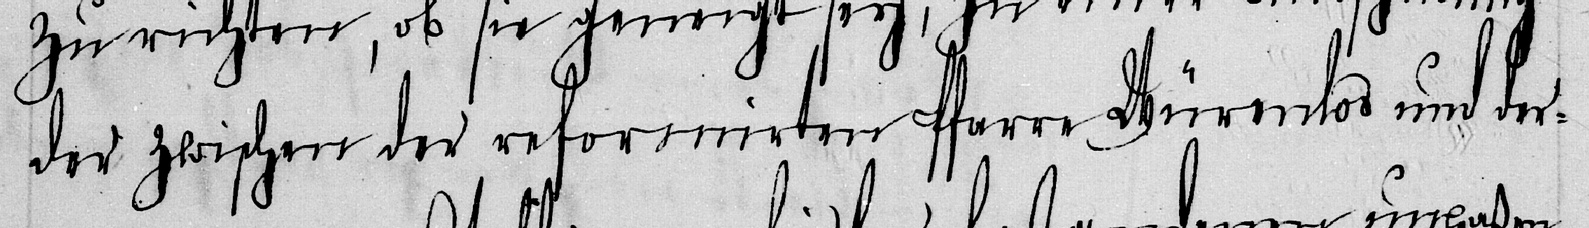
der zwischen der reformierten Pfarre Würenlos und der¬
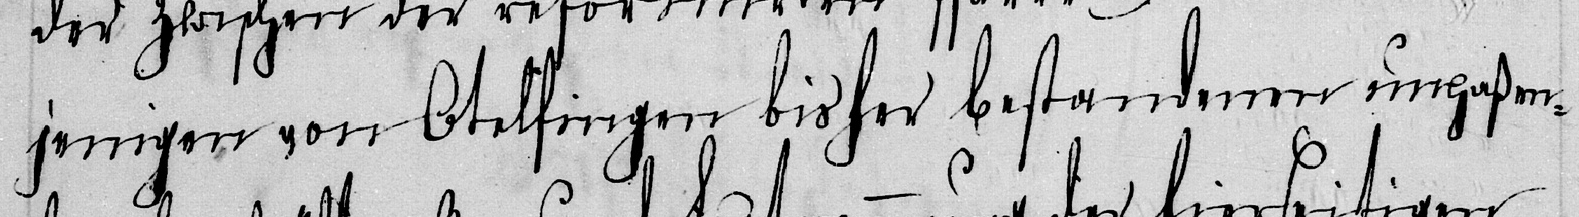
jenigen von Otelfingen bisher bestandenen unpaßen¬
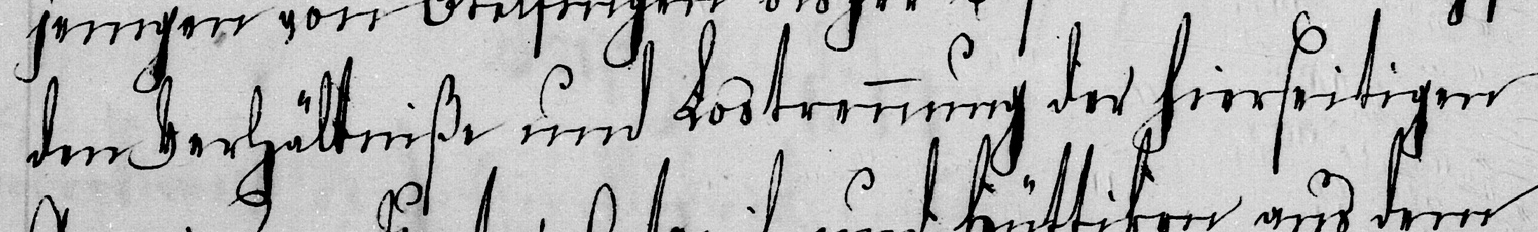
den Verhältniße und Lostrennung der hierseitigen
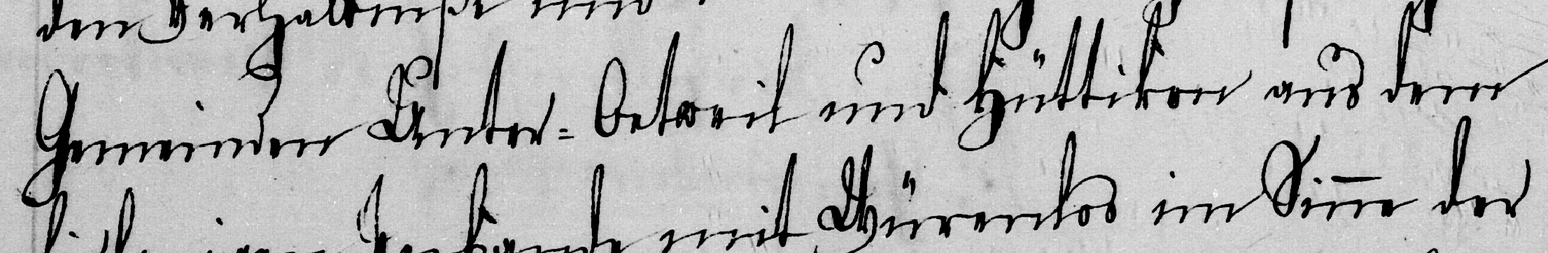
Gemeinden Unter-Oetweil und Hüttikon aus dem
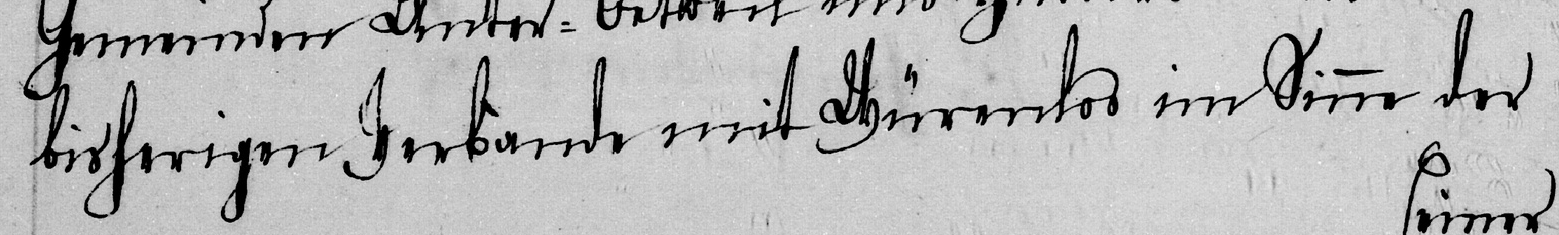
bisherigen Verbande mit Würenlos im Sinne der
